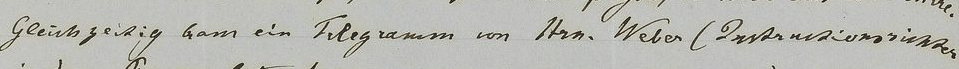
Gleichzeitig kam ein Telegramm von Hrn. Weber (Instructionsrichter
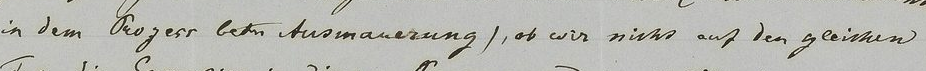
in dem Prozess betr. Ausmauerung), ob wir nicht auf den gleichen
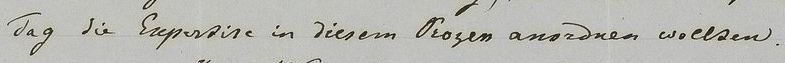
Tag die Expertise in diesem Prozess anordnen wollten.
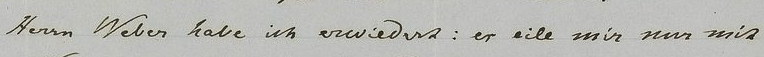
Herrn Weber habe ich erwiedert: es eile mir nur mit
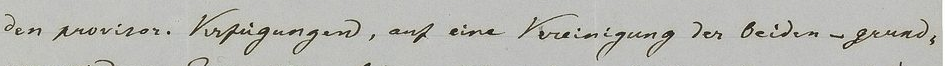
den provisor. Verfügungen, auf eine Vereinigung der beiden – grund-
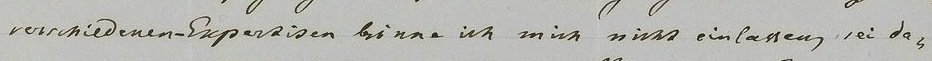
verschiedenen – Expertisen könne ich mich nicht einlassen, sei da-
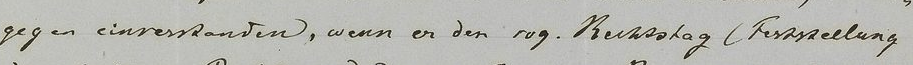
gegen einverstanden, wenn er den sog. Rechtstag (Feststellung
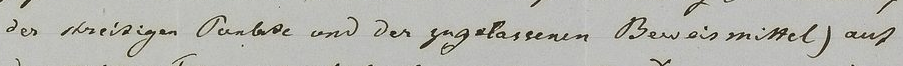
der streitigen Baulose und der zugelassenen Beweismittel) auf
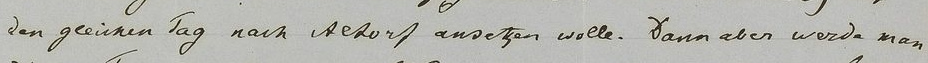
den gleichen Tag nach Altorf ansetzen wolle. Dann aber werde man
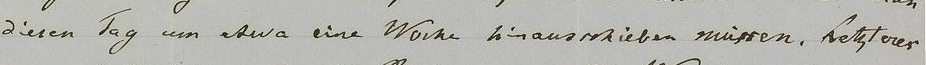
diesen Tag um etwa eine Woche hinausschieben müssen. Letzteres
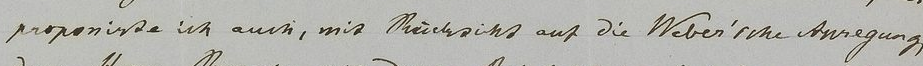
proponirte ich auch, mit Rücksicht auf die Weber'sche Anregung,
